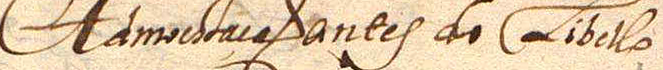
Admoestaçaõ antes do Libello
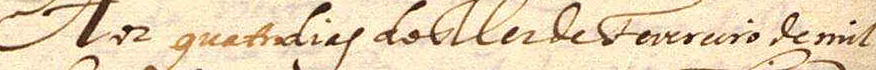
Aoz quatro dias do Mes de Fevereiro de mil
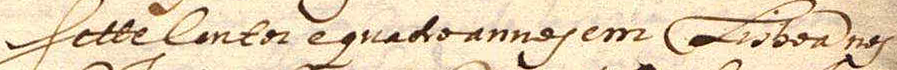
setteCentos e quatro annos em Lisboa nos
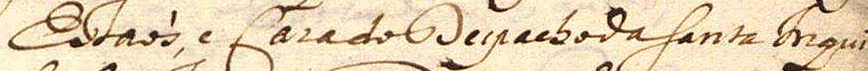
Estaós, e Caza do Despacho da santa Inqui
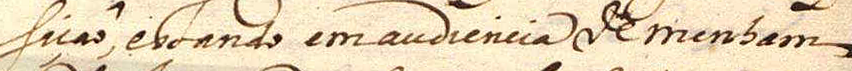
siçaõ, estando em audiencia de menham
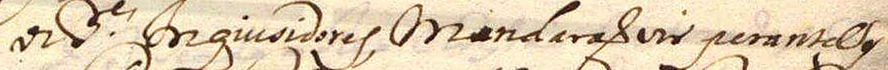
os S.res Inquisidores, Mandaraõ vir perante Sy
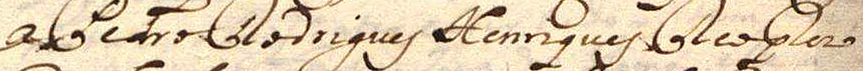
a Pedro Rodrigues Henriques Reo prezo
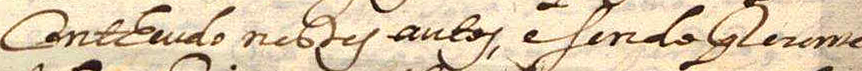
Contheudo nestes autos, e sendo prezente
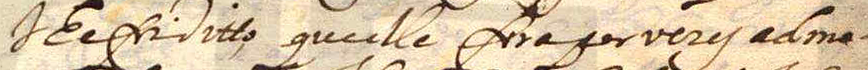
lhe foi ditto, que elle fora por vezes admo
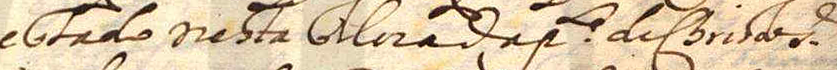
estado nesta Meza da p.te de Christo s.or
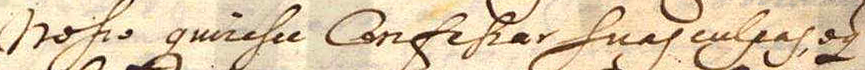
nosso quizesse Confessar suas culpas, o q̄
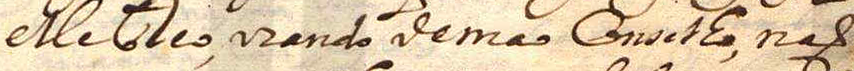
elle Reo, vzando de mao Conselho, naõ
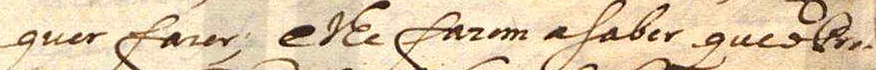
quer fazer; e lhe fazem a saber que o Pro
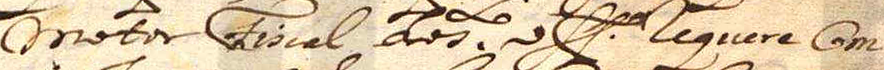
motor Fiscal do s.to off.o Requere Com
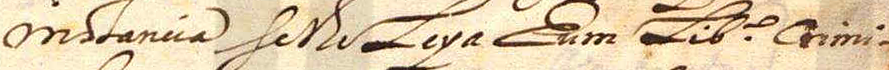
instancia se lhe Leya hum Lib.o Crimi
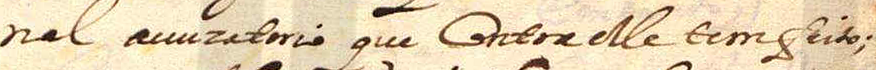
nal accuzatorio que Contra elle tem feito;
